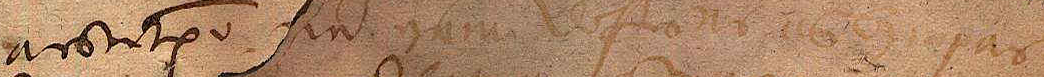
a este t̄po nā eram defesas as briujas
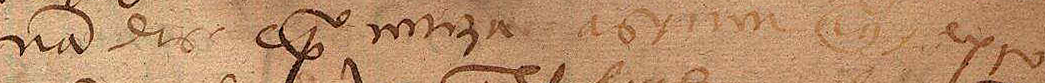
nā dise e p̄o certeza asynou aq̄y e pro
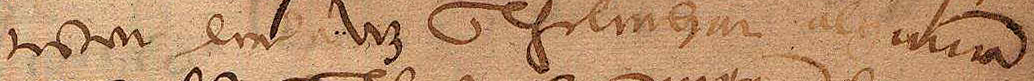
testou de cada vez q̄ lhe lenbrar alguma
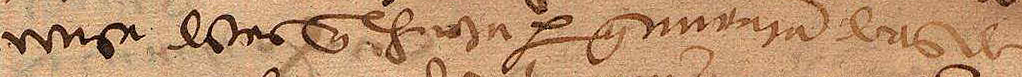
cousa destas q̄ lhe ora ꝑgumtarā de as de
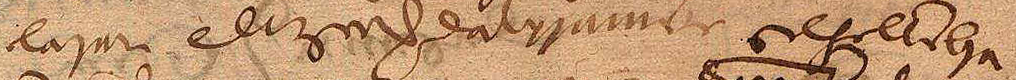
clarar e dizer ꝟdadeyramēte se lhe llēbra
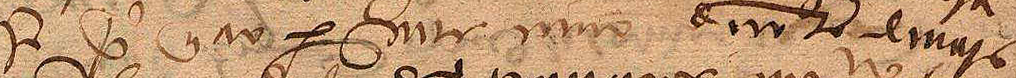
rē p̄o q̄ aoo ꝑsente como dito tē de majs
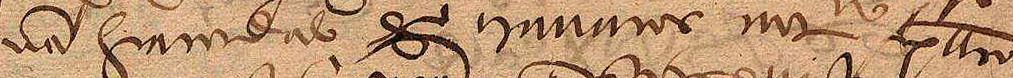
nā he acordado djo trauacos notro ap̄llco
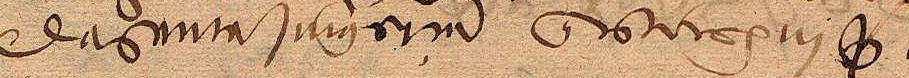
e da santa Jmq̄syçā q̄ esto esp̄uj
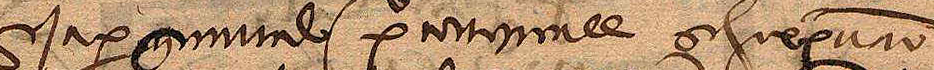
SeJa ꝑgumtado p̄o corte rreall se he xpaão
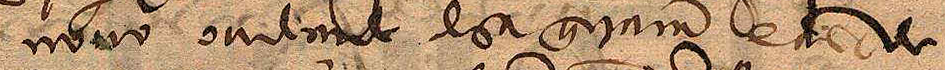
nouo ou deçende desa geracā e asy de
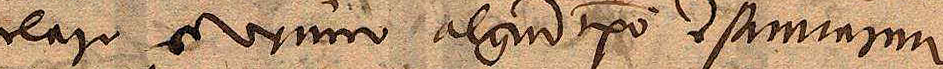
clare se vyueo alguū t̄po ē samtarem
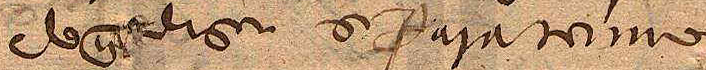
e do q̄ diser se fara termo
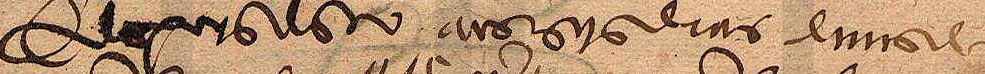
E depoys desto aos sejs dias do mes de
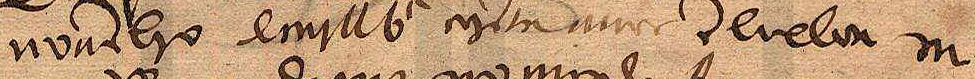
nouēbro de mjll bc corēta anos ē lixboa eu
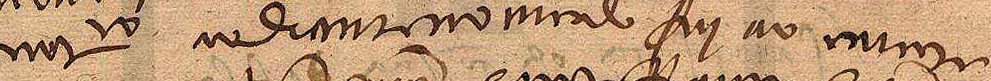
notro ao diante nomeado fuj ao carcere
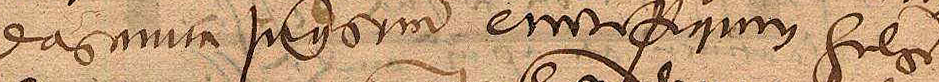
da samta Jnq̄sycā e notefiquey ho desē
